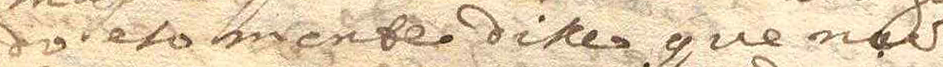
do e somente disse que naõ
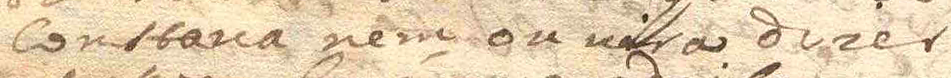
constaua nem ouuira dizer
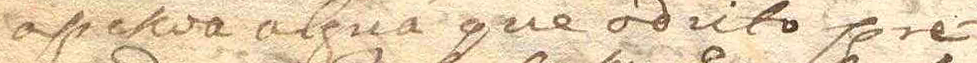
a pessoa alguā que o dicto pre
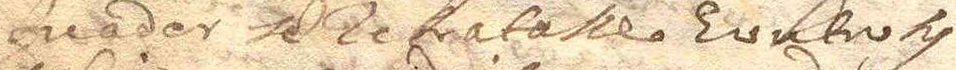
guador se Retratasse E outrosy
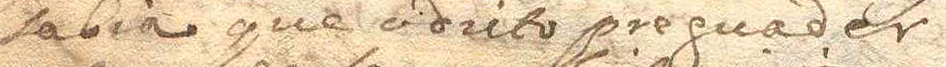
sabia que o dicto preguador
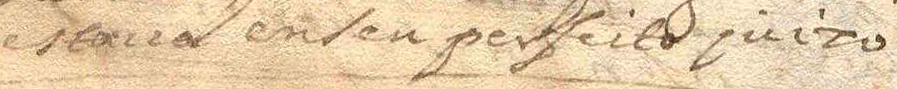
estaua en seu perfeito juizo
